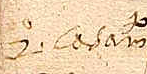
2.o casamto
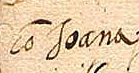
cō Joana
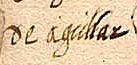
de aguillar
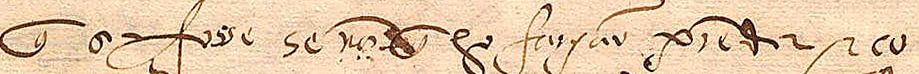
q̄ se fosse se nā_ q̄ ho faryão prēder e co
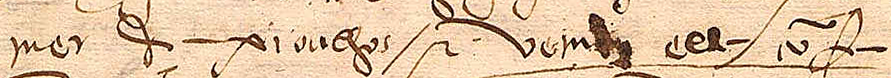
mer de pioulhos / e vem_ elle cōfe
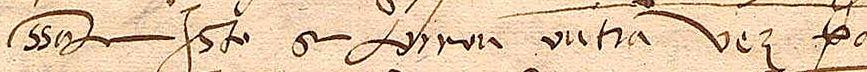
ssāte Jsto se tornou outra vez ꝑa
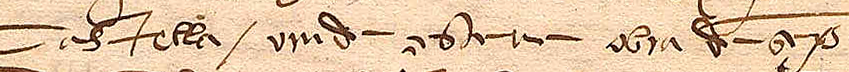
Castella / omde esteue obra de seys
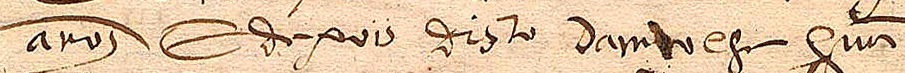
ānos E depois disto damdolhe hūu
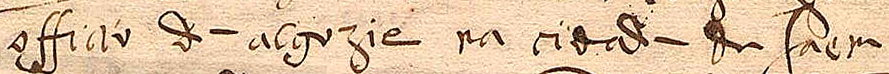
officio de algozil na cidade de Jaem
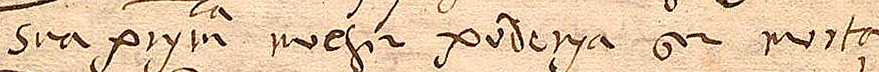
sua prymra molher poderya ser morta
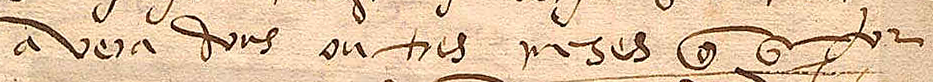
avera dous ou tres meses q̄ se tor
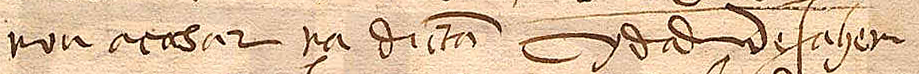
nou a casar na dīcta Cydade de Jahem
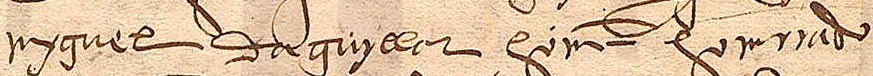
myguel daguyllar hom̄e homrrado
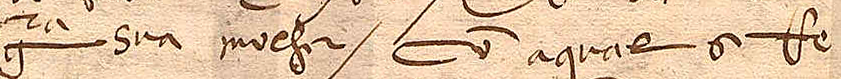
figra sua molher / Cō a qual se Re
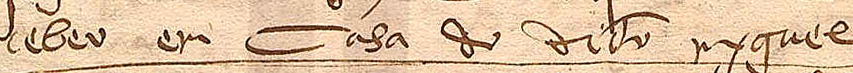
cebeo em Casa do dic̄to myguel
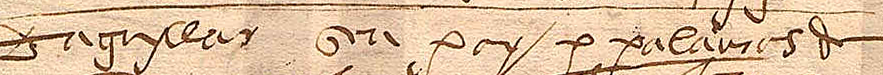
daguyllar seu pay / ꝑ palauras de
